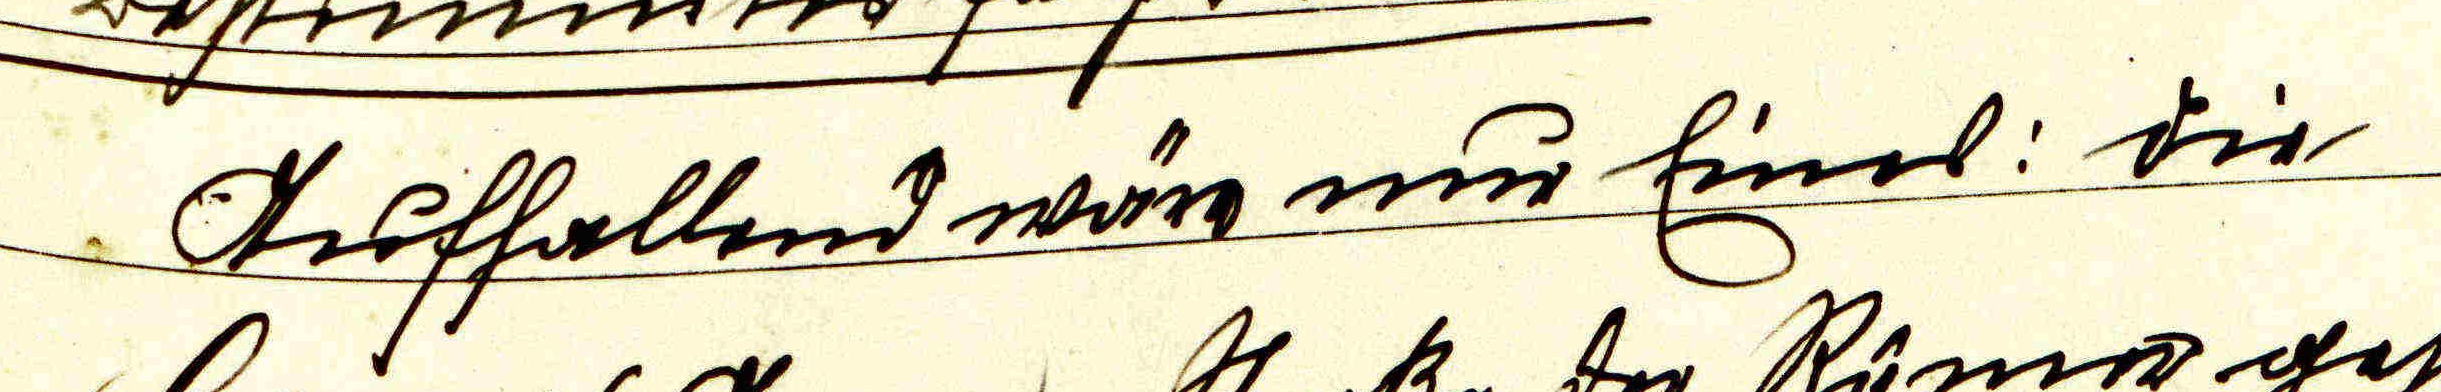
Auffallend wäre nur Eines: die
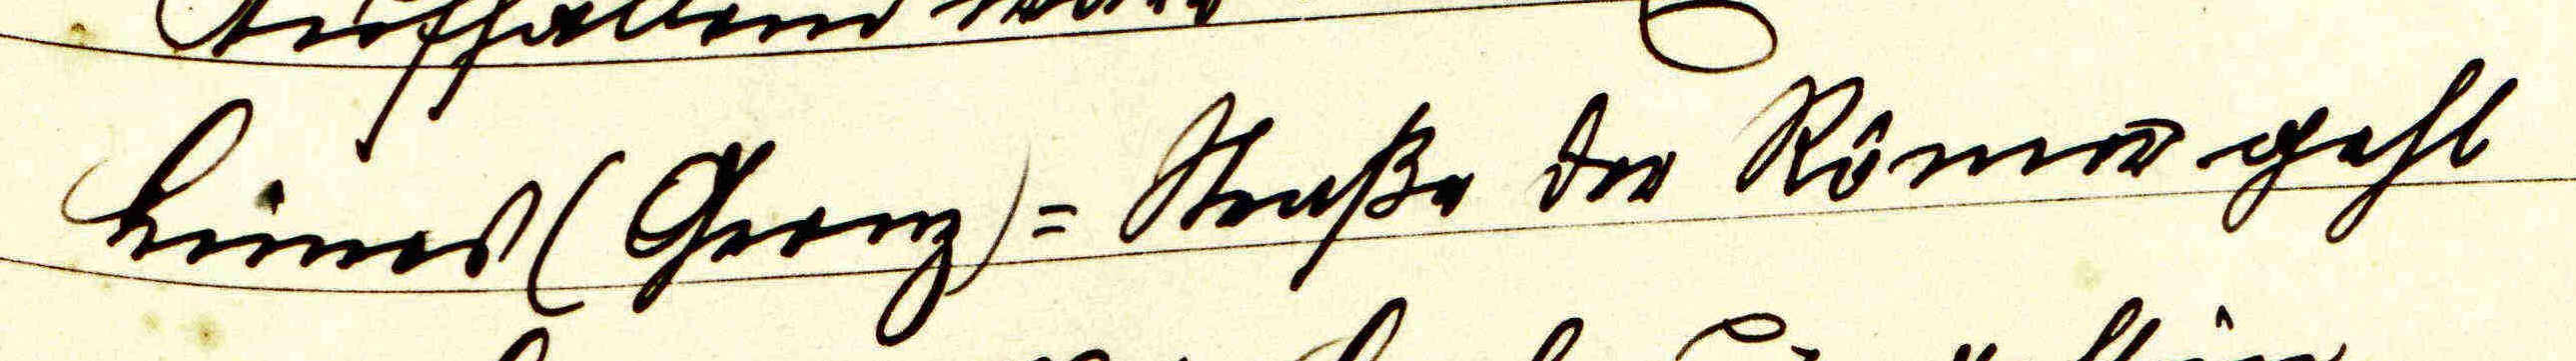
Limes(Grenz)-Straße der Römer geht
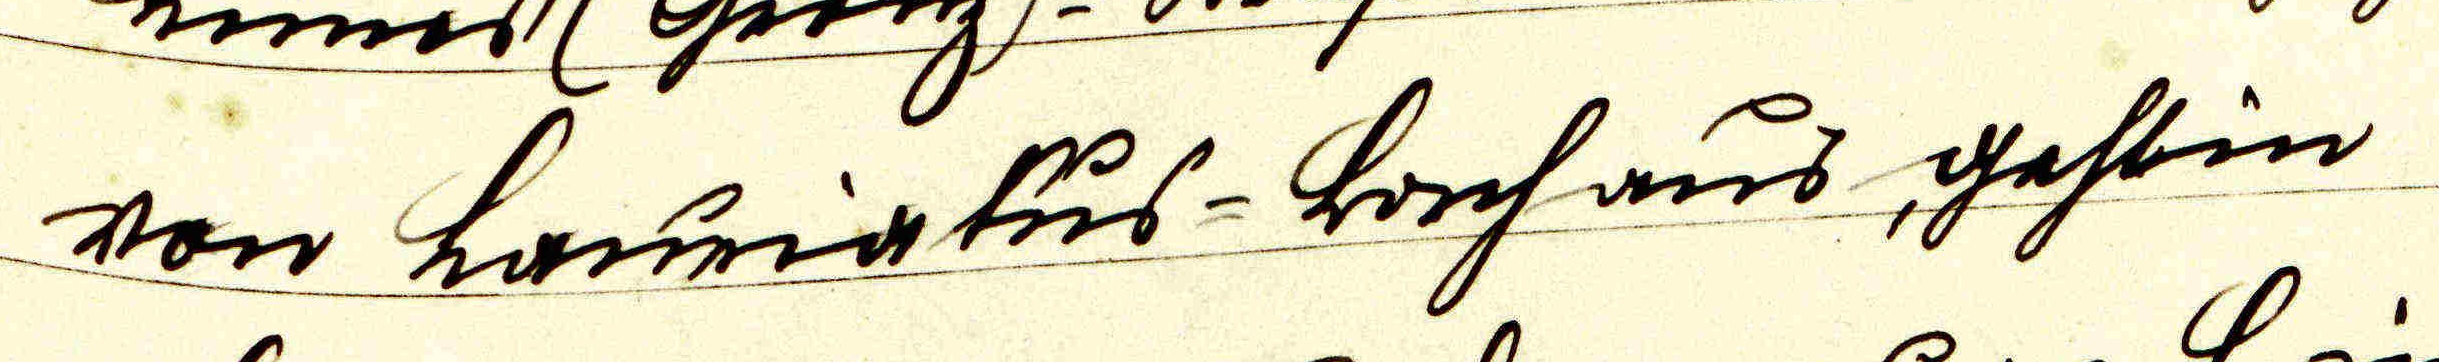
von Lauriakus-Lorch aus, geht in
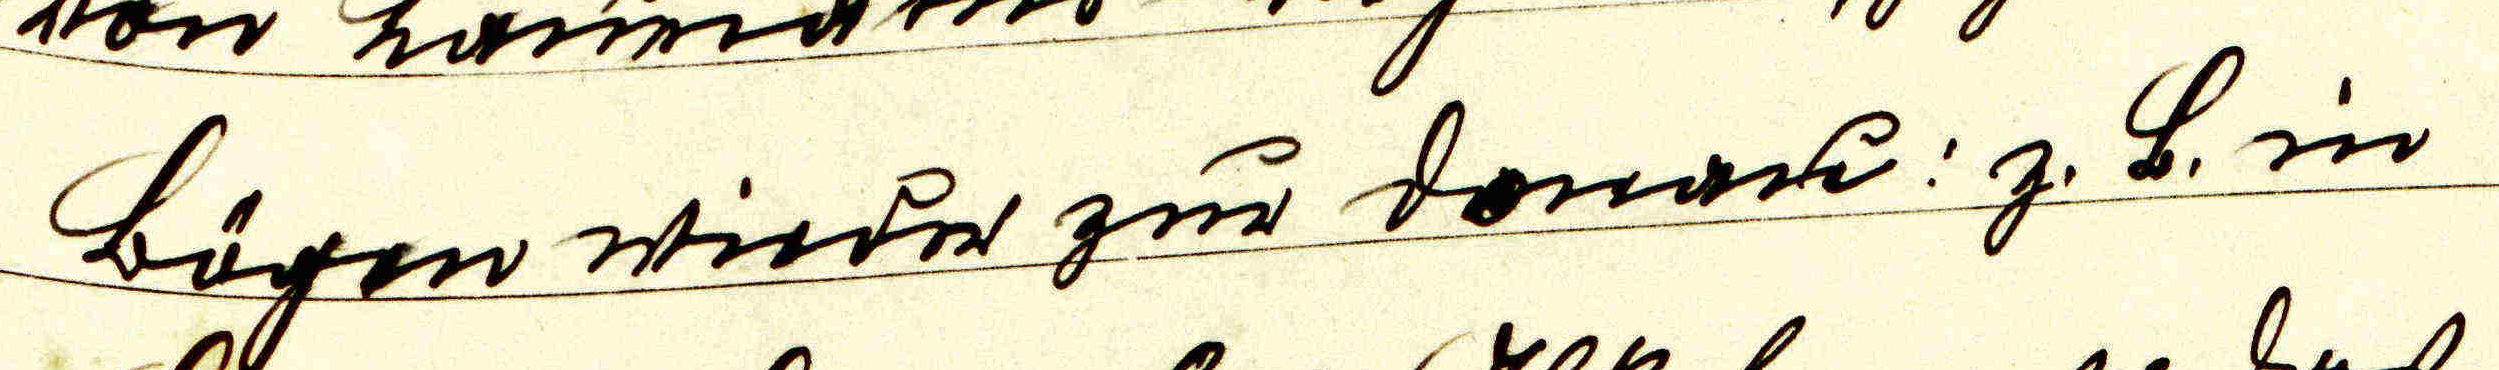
Bögen wieder zur Donau: z.B. in
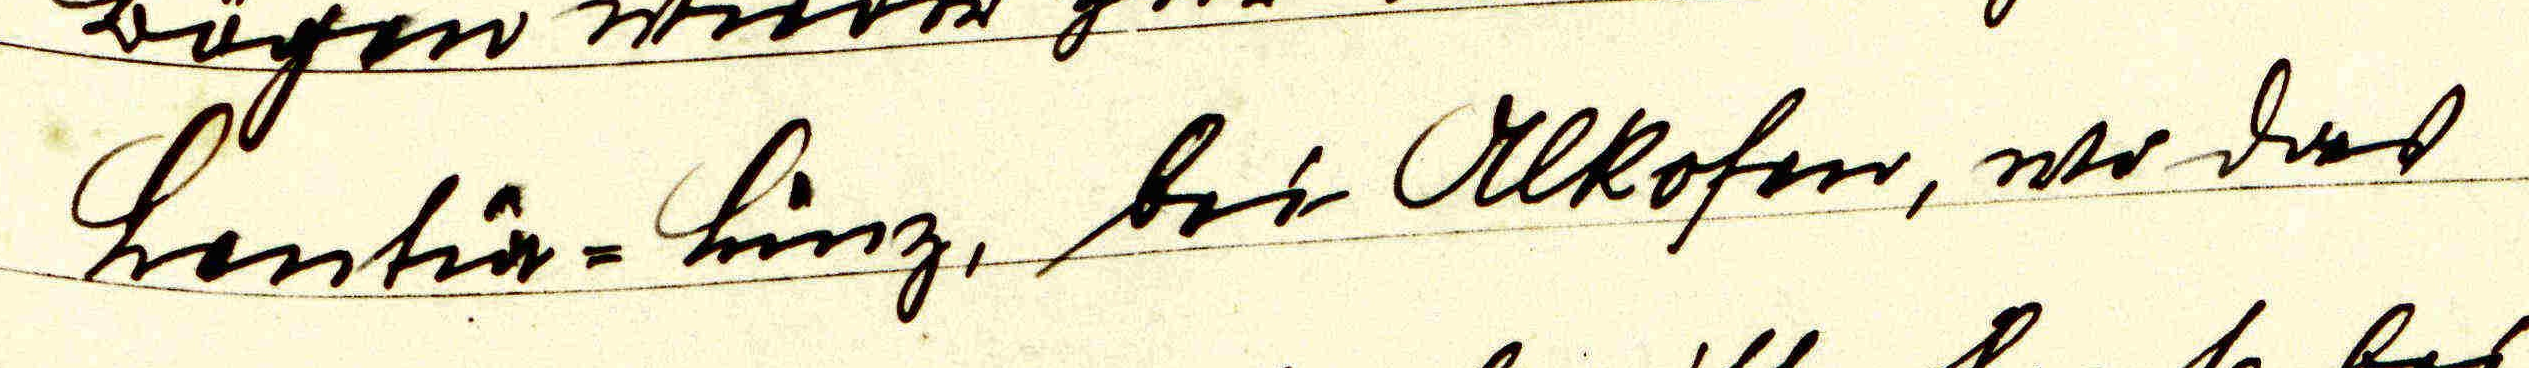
Lentia-Linz, bei Alkoven, wo das
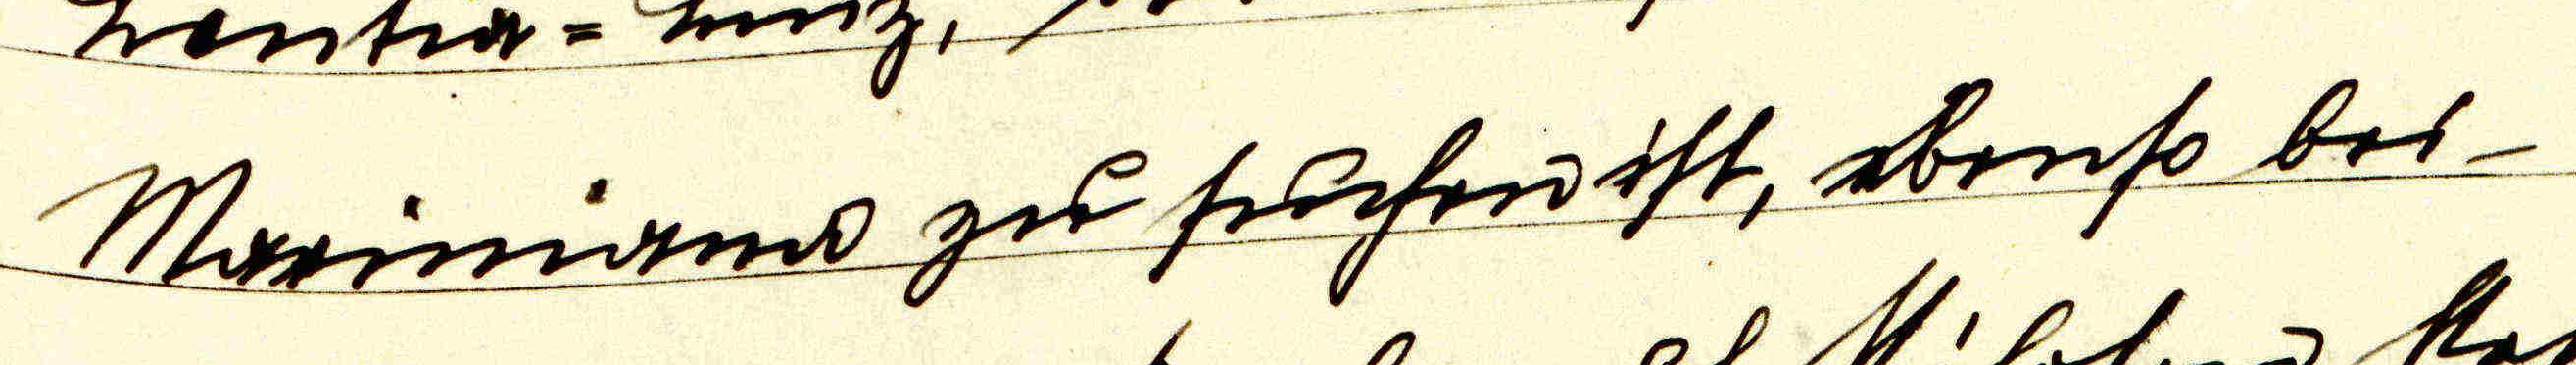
Mariniana zu suchen ist, ebenso bei
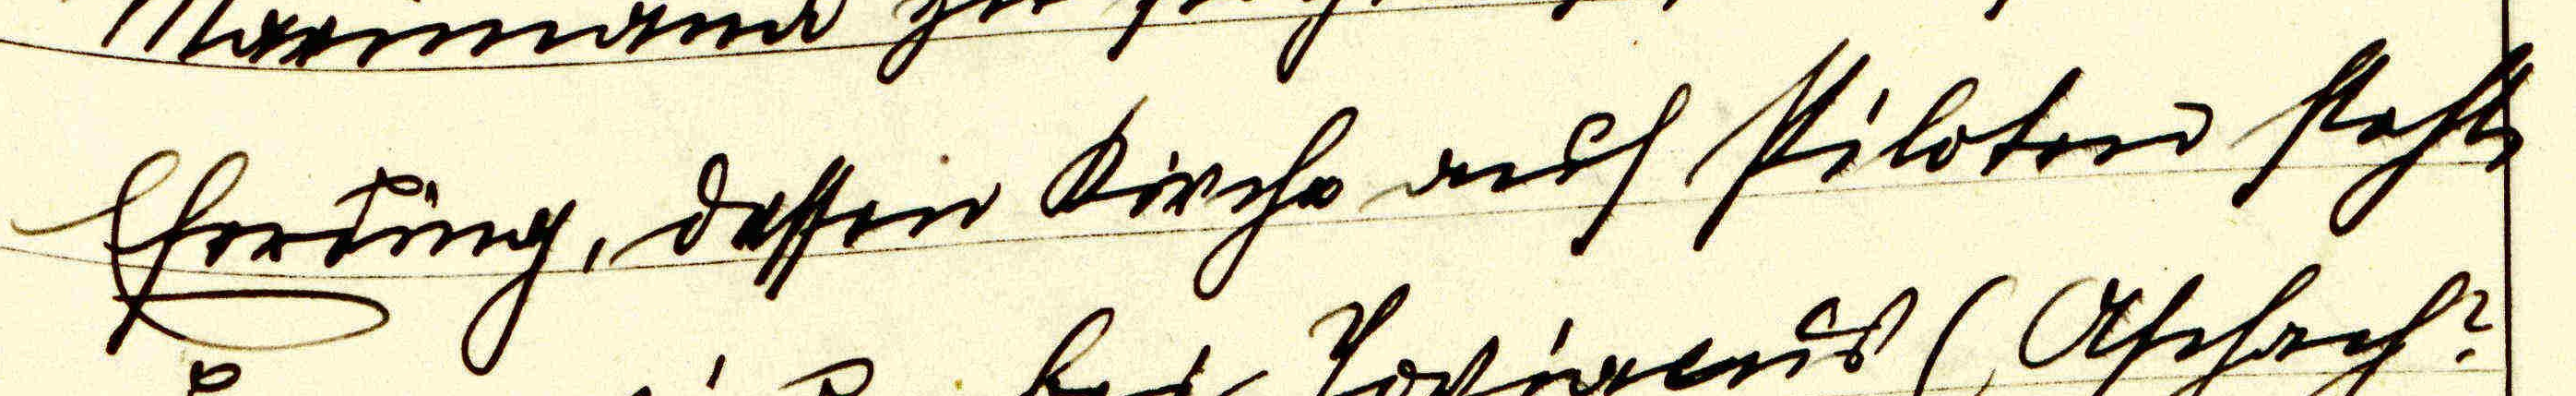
Eferding, dessen Kirche auf Piloten steht,
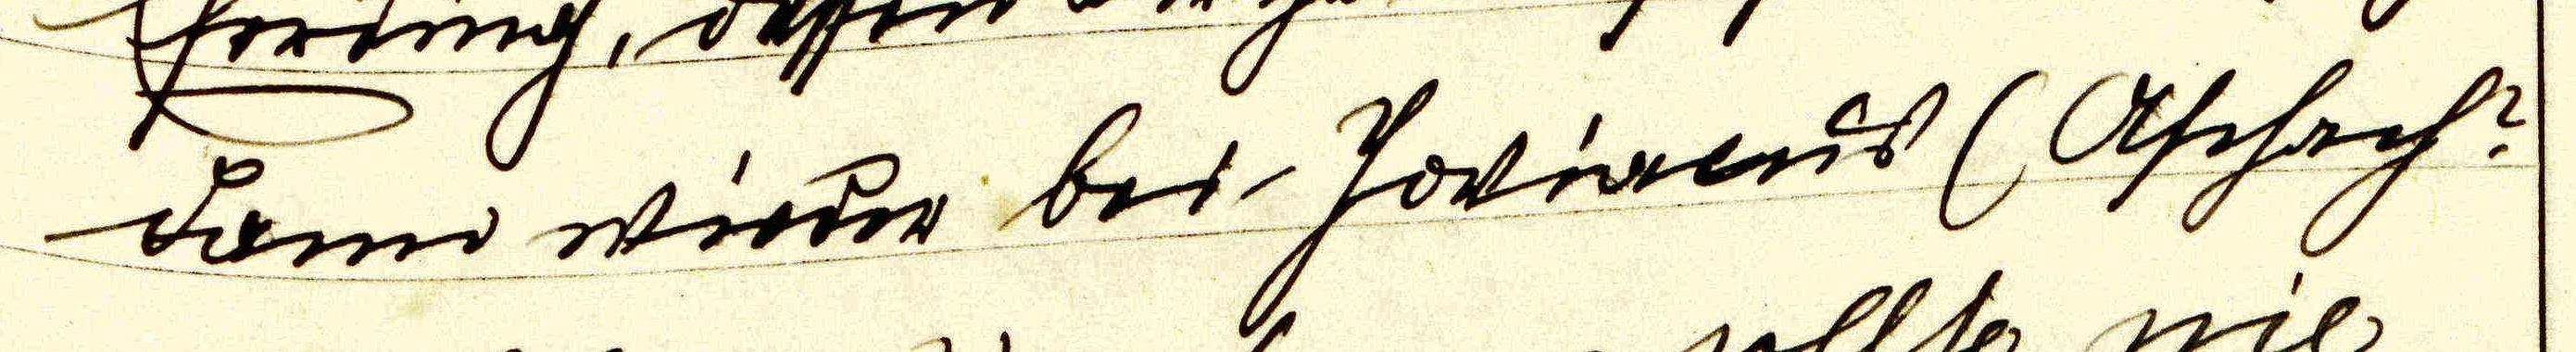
dann wieder bei Ioviacus (Aschach?
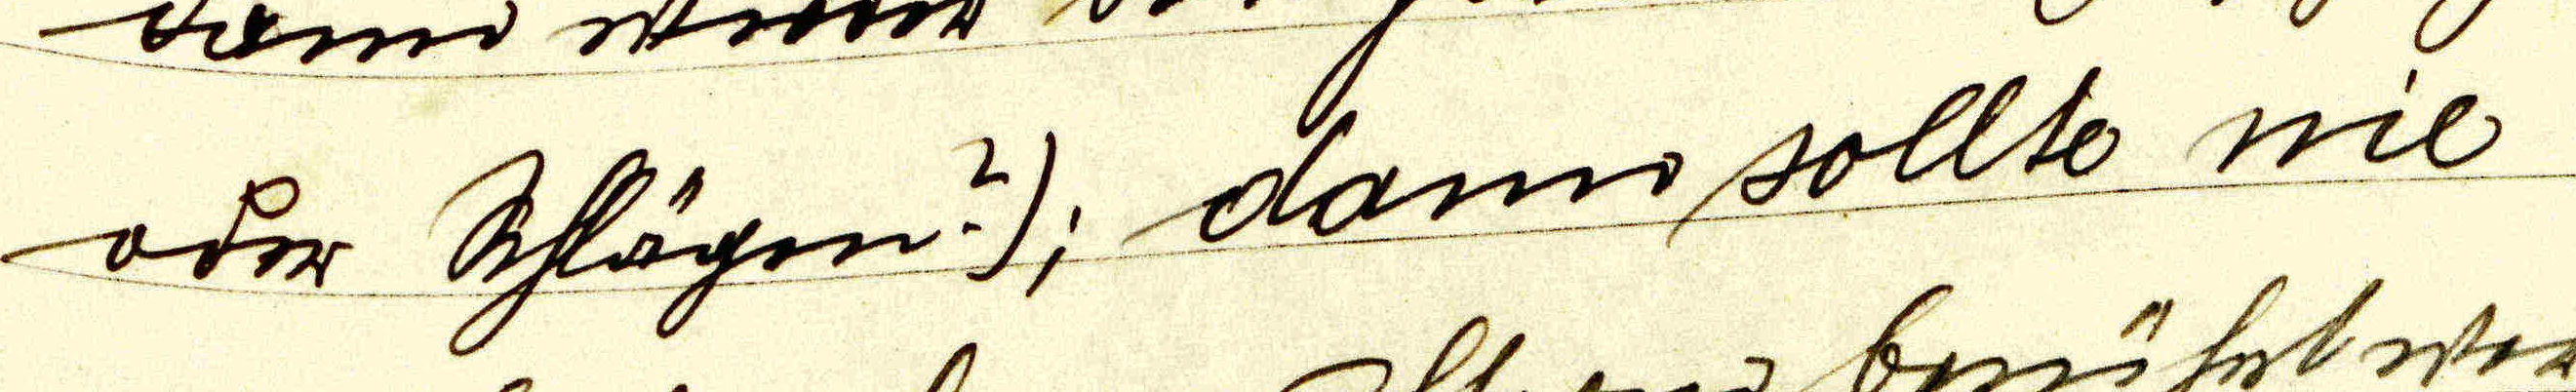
oder Schlägen?); dann sollte nie
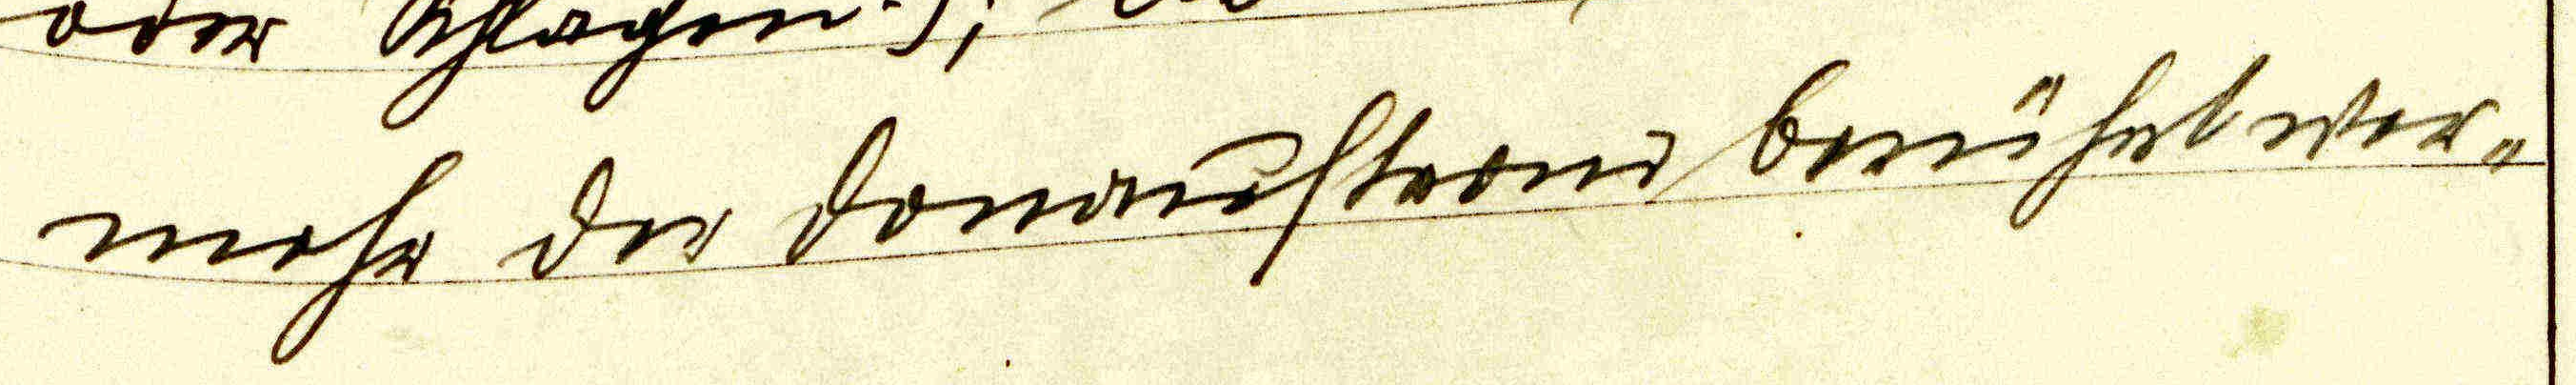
mehr der Donaustrom berührt wer-
